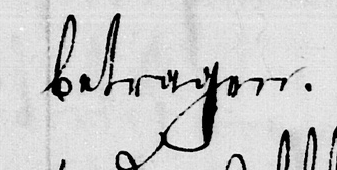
betragen.
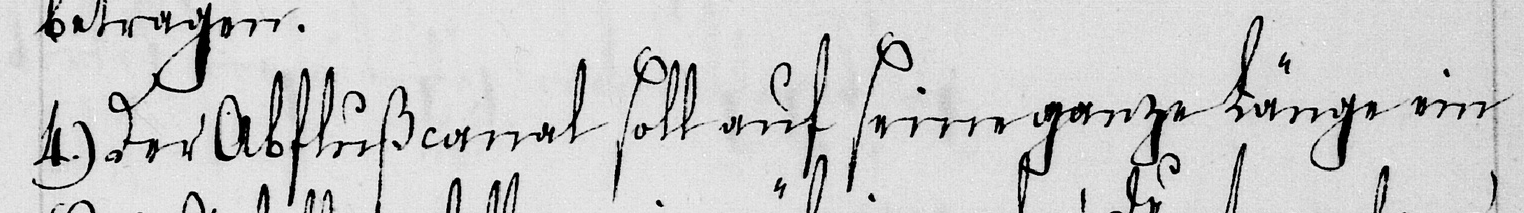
4.) Der Abflußcanal soll auf seine ganze Länge ein
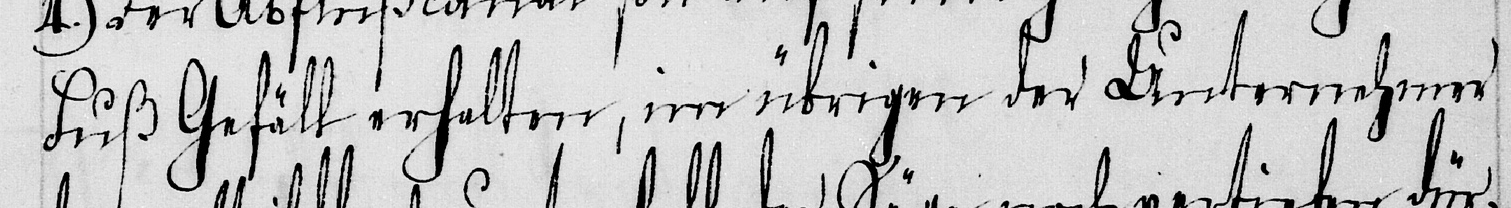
Fuß Gefäll erhalten, im übrigen der Unternehmer
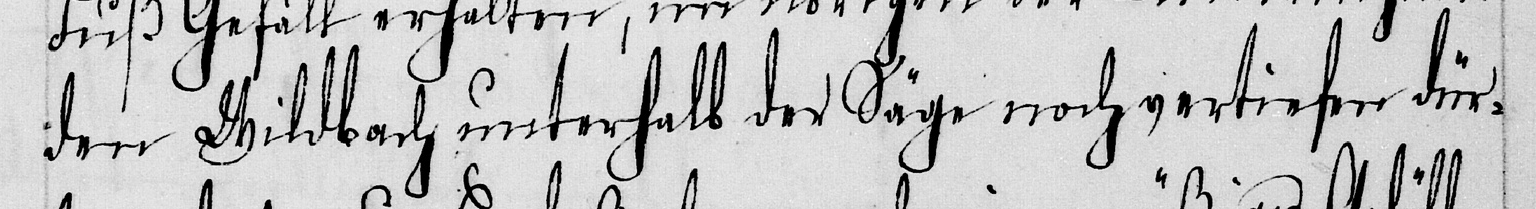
den Wildbach unterhalb der Säge noch vertiefen dür¬
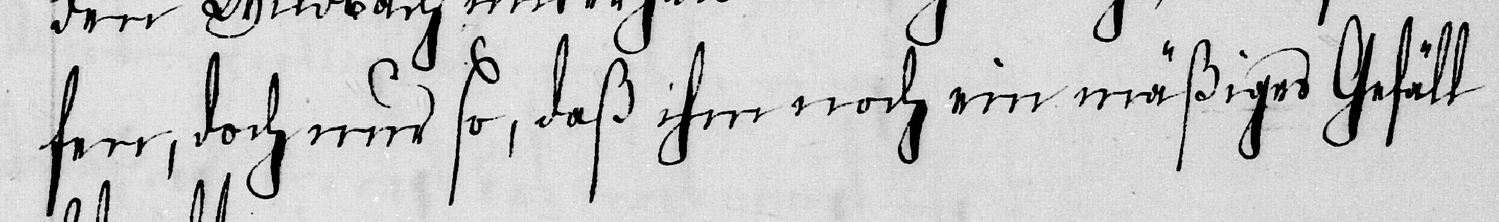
fen, doch nur so, daß ihm noch ein mäßiges Gefäll
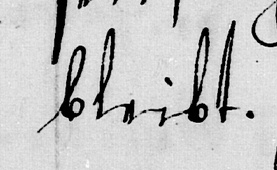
bleibt.
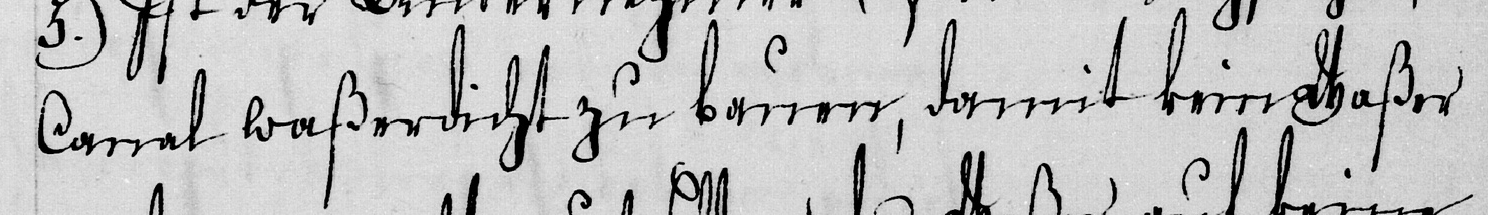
Canal waßerdicht zu bauen, damit kein Waßer
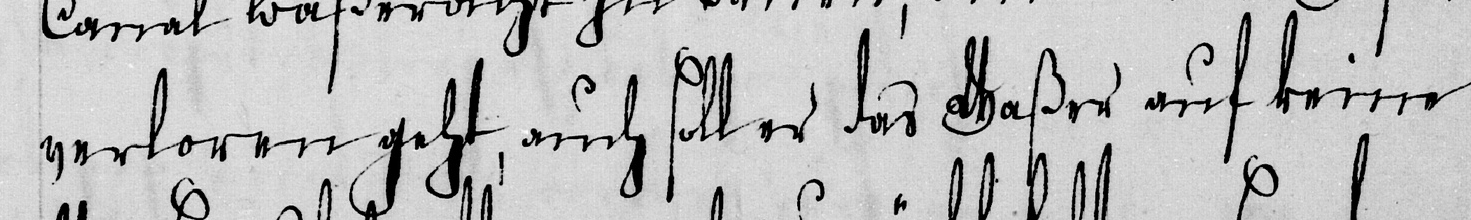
verloren geht, auch soll er das Waßer auf keine
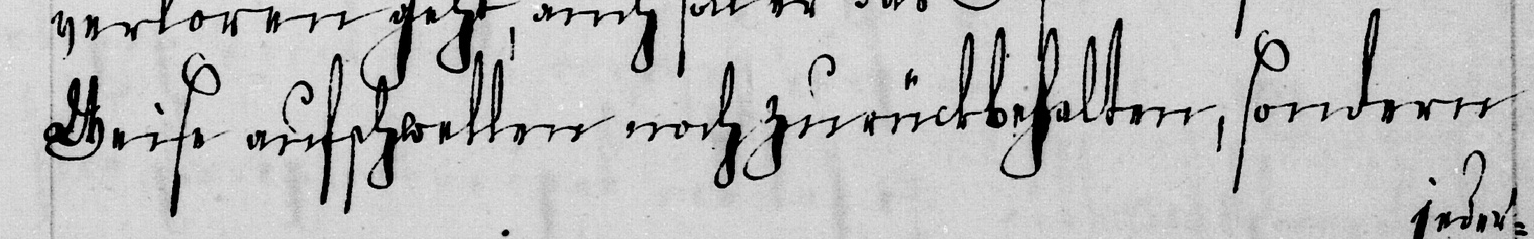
Weise aufschwellen noch zurückbehalten, sondern
